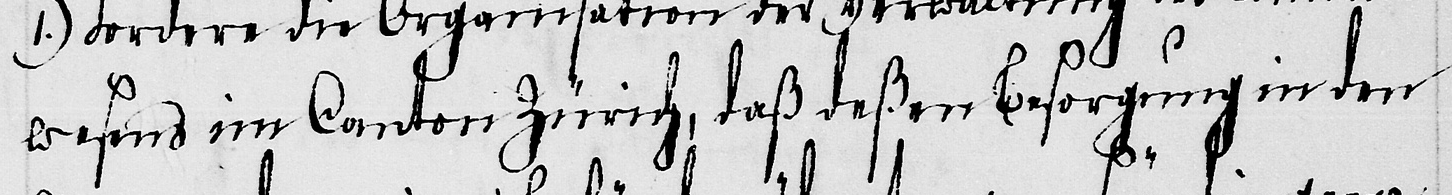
wesens im Canton Zürich, daß deßen Besorgung in den
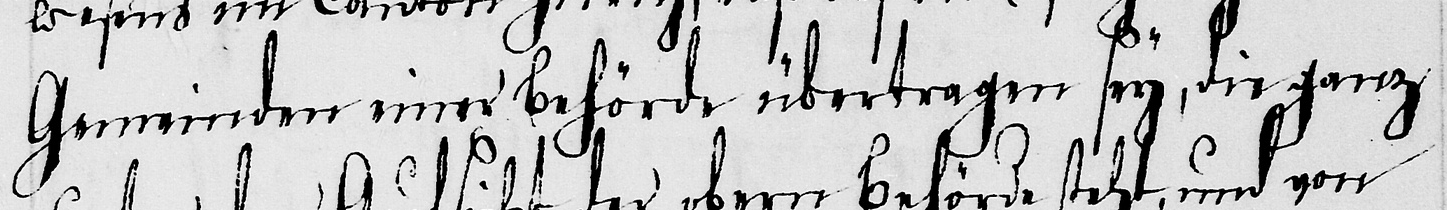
Gemeinden einer Behörde übertragen sey, die ganz
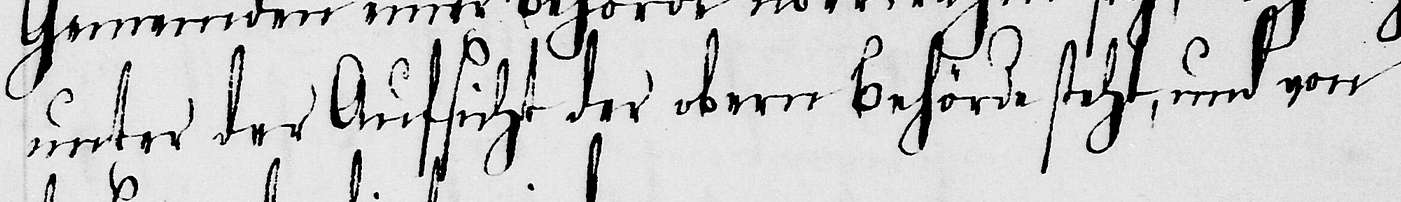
unter der Aufsicht der obern Behörde steht, und von
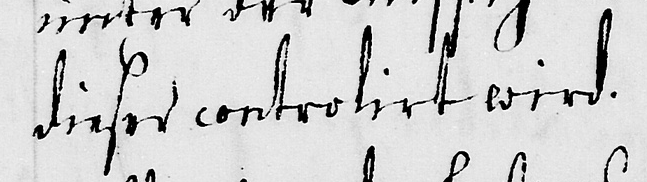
dieser controlirt wird.
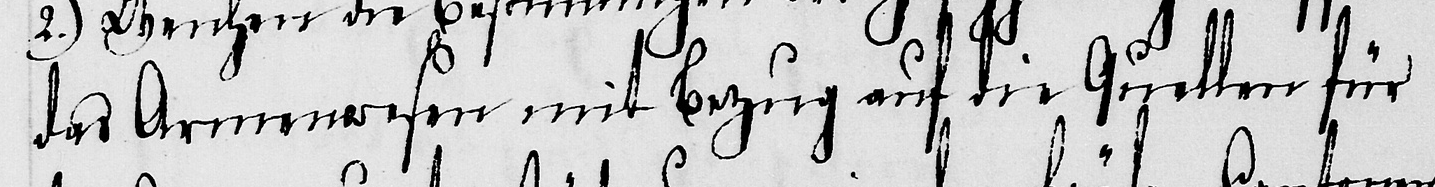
das Armenwesen mit Bezug auf die Quellen für
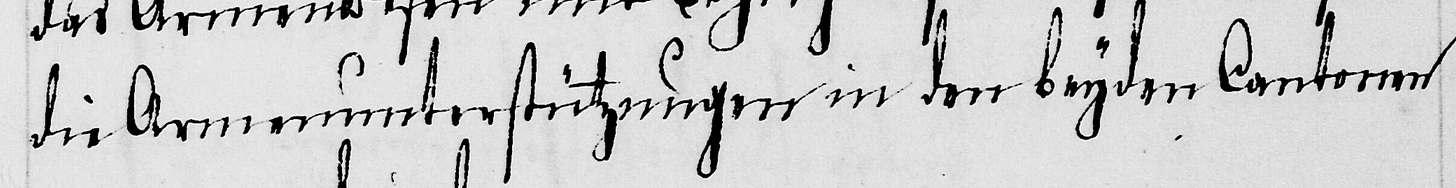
die Armenunterstützungen in den beyden Cantonen
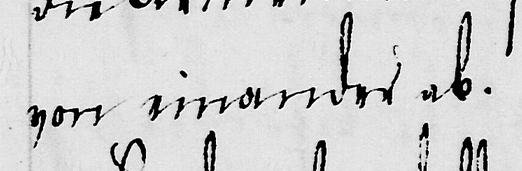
von einander ab.
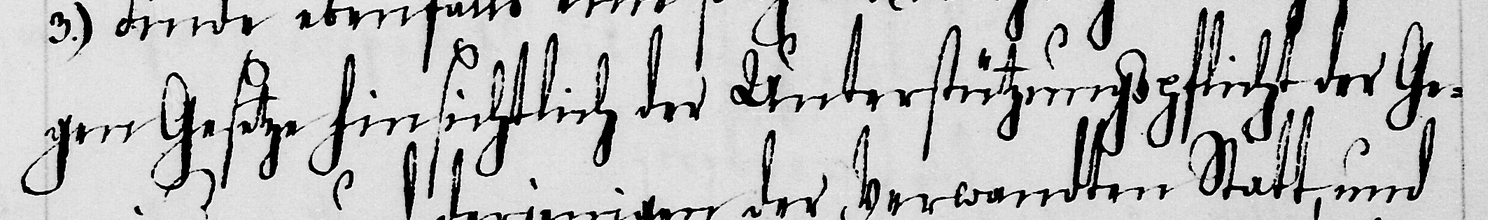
gen Gesetze hinsichtlich der Unterstützungspflicht der Ge¬
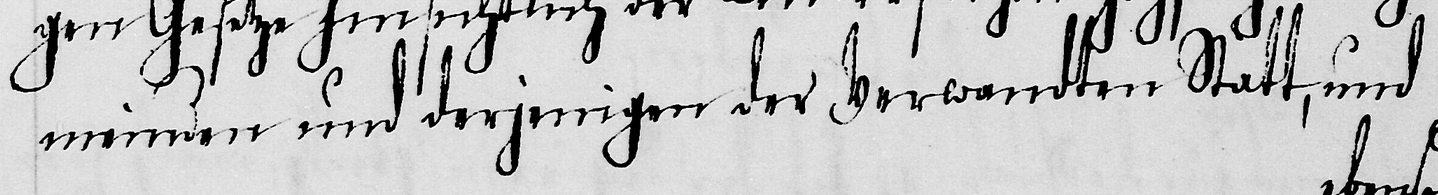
meinden und derjenigen der Verwandten Statt, und
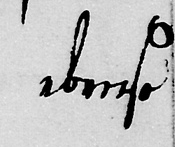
seiti¬
